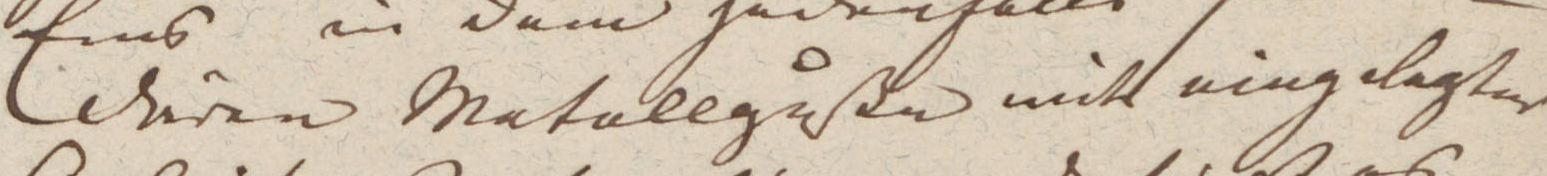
dären Metallgusse mit eingelegter
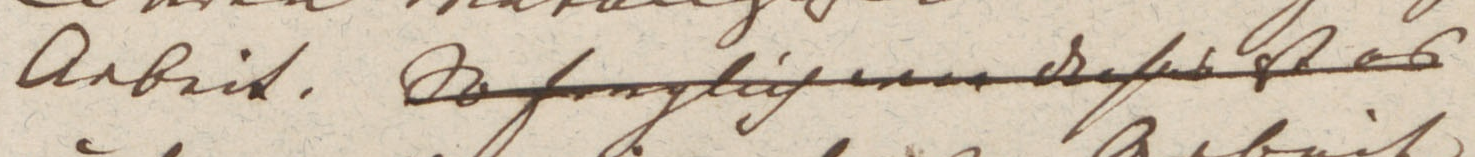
Arbeit. So fraglich wie dieses ist es
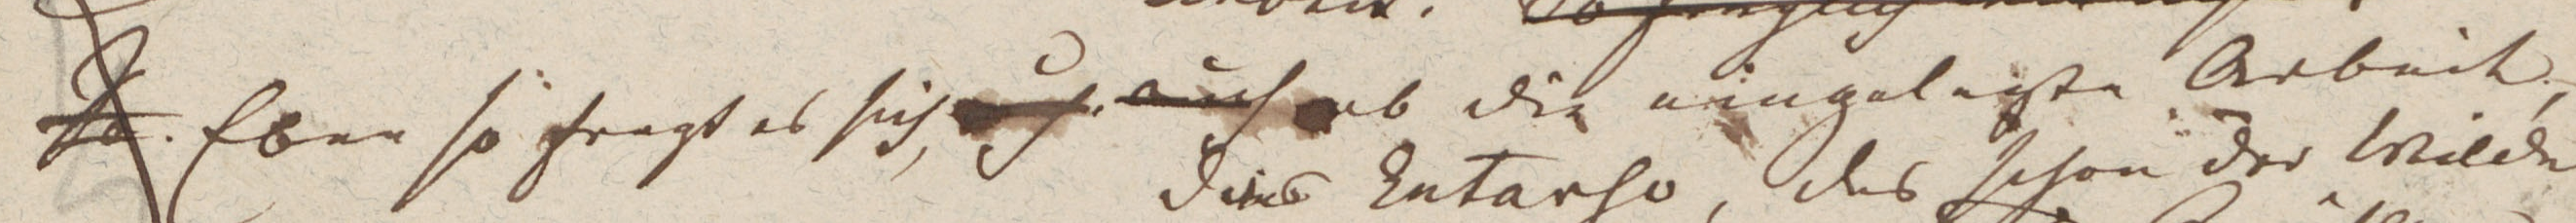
So Eben so fragt es sich, auch auch ob die eingelegte Arbeit,
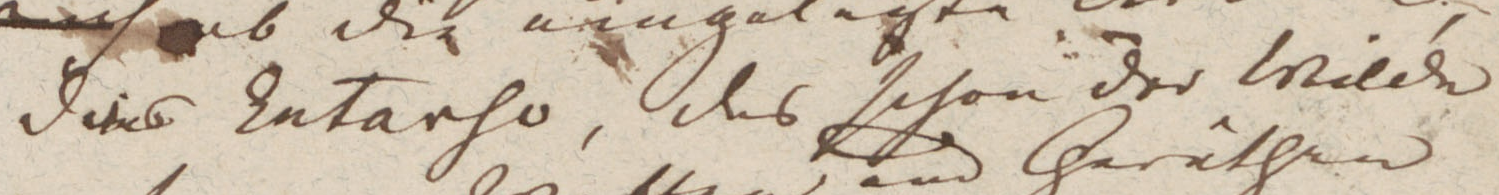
dieas Entarso, das schon der Wilde
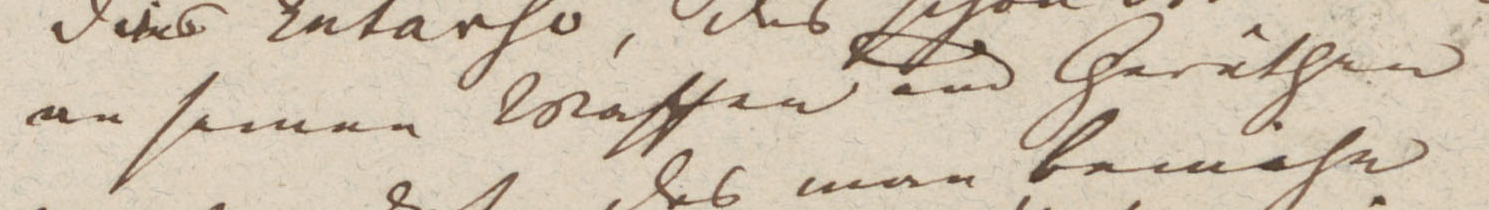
an seinen Waffen und Geräthen
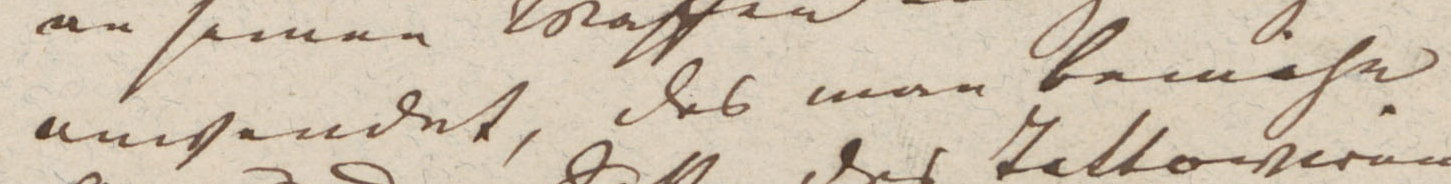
anwendet, das man beinahe
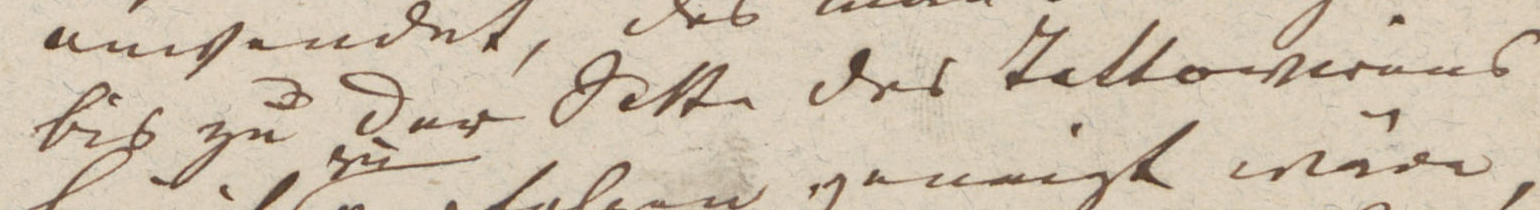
bis zu der Sitte des Tettowirens
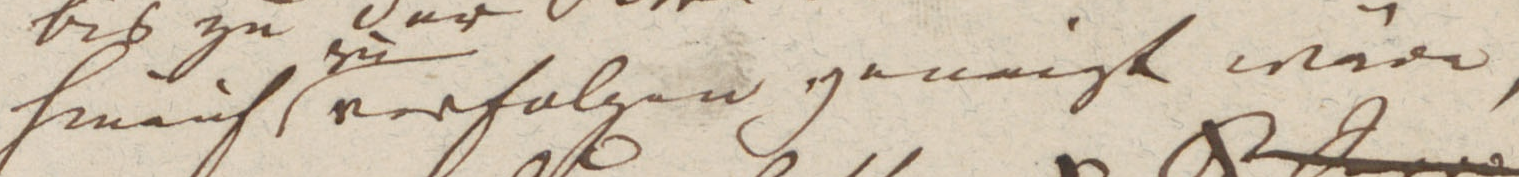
hinauf zu verfolgen geneigt wäre,
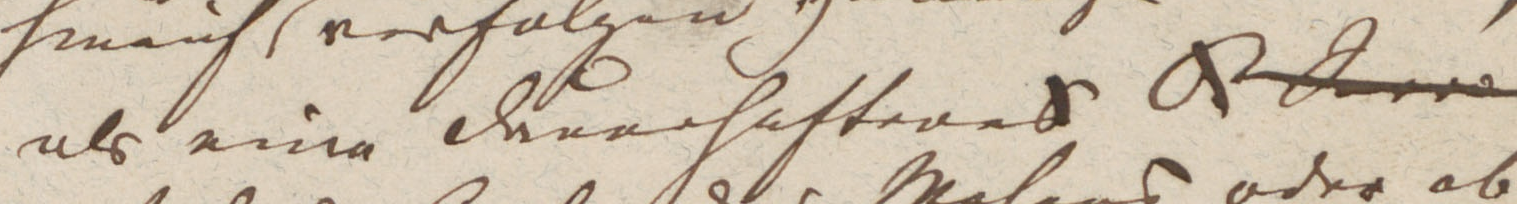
als eine dauerhafteres R Surro-
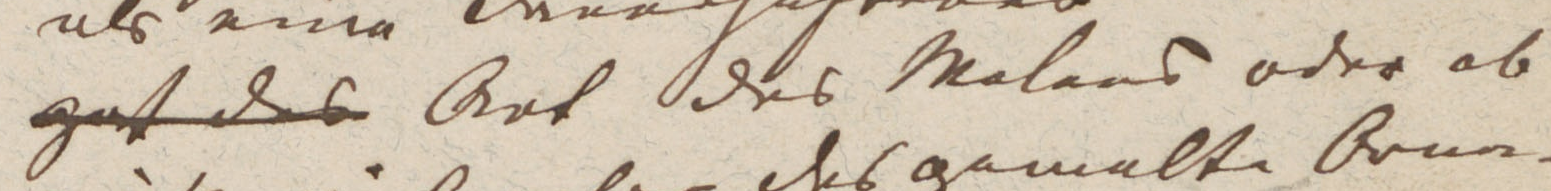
gat des Art des Malens oder ob
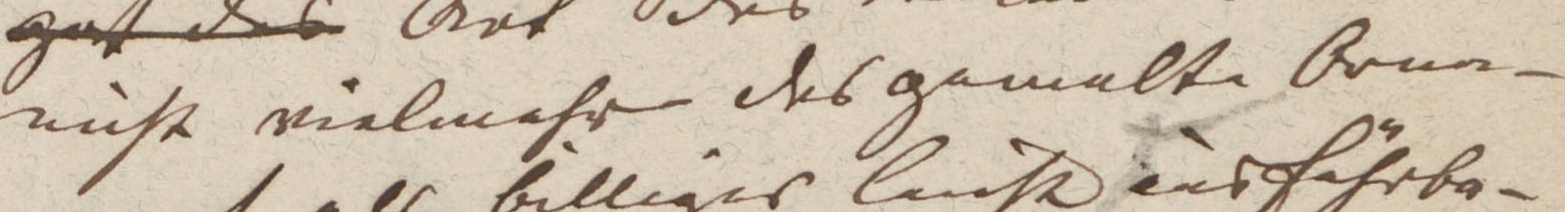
nicht vielmehr das gemalte Orna-
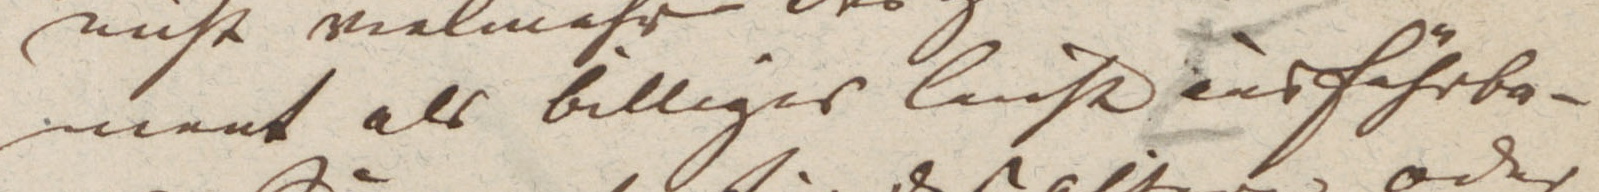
ment als billiges leicht % ausführba-
